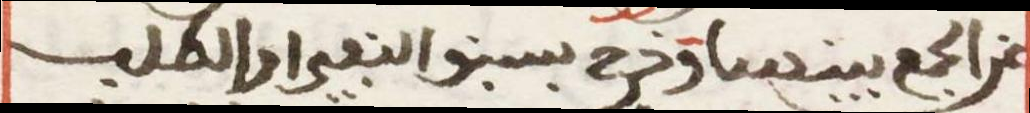عن الجمع بينهما وخرج بسبق النفي او الطلب
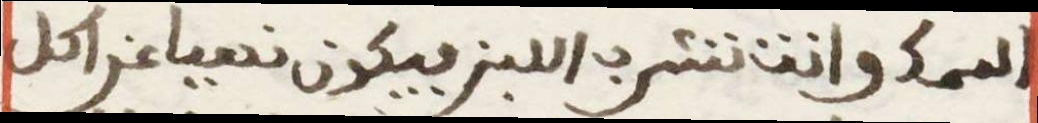السمك وانت تشرب اللبن فيكون نهيا عن اكل
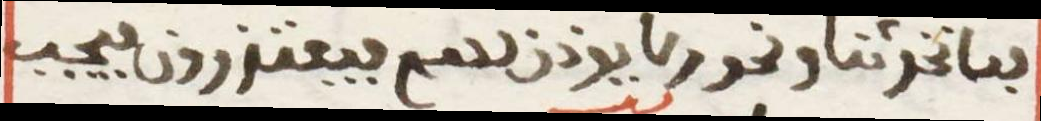فىاتحرثنا ونحو ولا يوذن لهم فيعتذرون فيجب
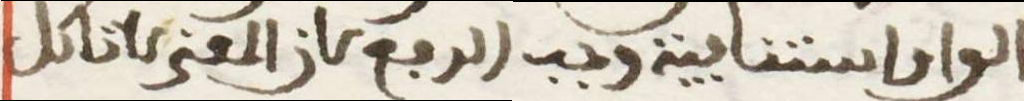الواو استنافية وجب الرفع كان المعنى لا تاكل
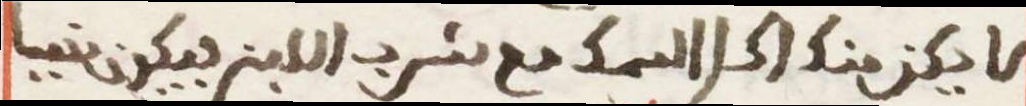لا يكن منك اكل السمك مع شرب اللبن فيكون نهيا
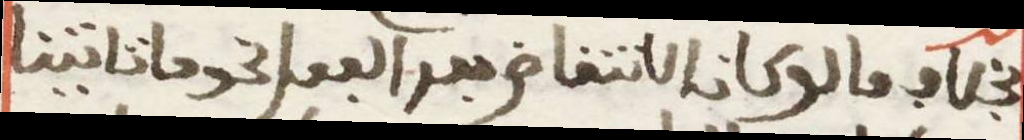بخلاف ما لو كان الانتقاض بعد الفعل نحو ما تاتينا
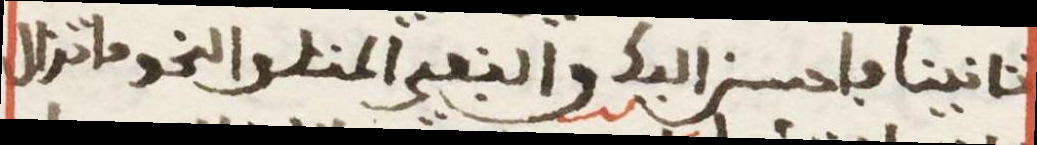تاتينا فاحسن اليك والنفي المتلو النحو ما تزال
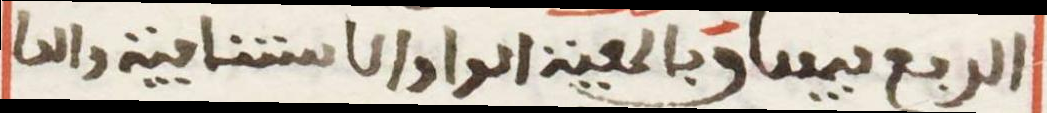الرفع فيها وبالمعية الواو الاستنافية والعا
